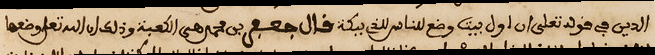الدين عي قوله تعلى ان اول بيت وضع للناس للذى ببكة قال جعفر بن محمد هى الكعبة وذلك ان الله تعلى وضعها
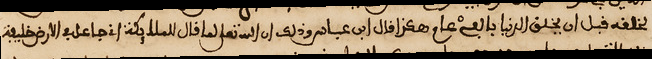لخلقه قبل ان يخلق الدنيا بالفى عام هكذا قال ابن عباس وذلك ان الله تعلى لما قال للملائكة انى جاعل في الارض خليفة
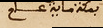بمكة ماية عام
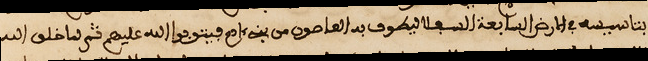بتاسيسه في الارض السابعة السفلا ليطوف به العاصون من بني ءادم فيتوبوا الله عليهم ثم لما خلق الله
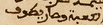الكعبة وصار يطوف
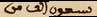سبعون الف من
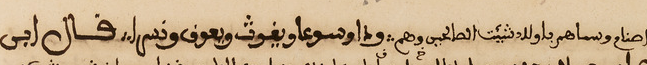اصنام وسماهم باولاد شيت الصالحين وهم وداوسوعا يغوث ويعوق ونسرا قال ابن
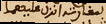لمغارته انزل عليهما
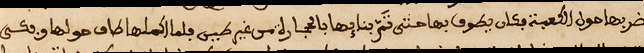ضربها حول الكعبة فكان يطوف بها حتى تم بنائها بالحجارة من غير طين فلما اكملها طاف حولها وبكى
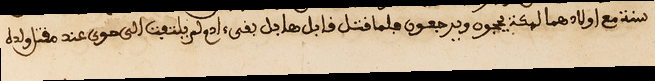سنة مع اولاد لمكة يحجون ويرجعون فلما قتل قابل هابل بقى ءادم لم يلتقت الى حوى عند
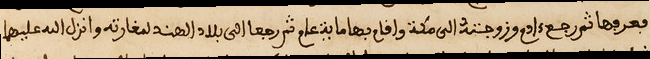فعرفها ثم رجع ءادم وزوجته الى مكة واقام بها ماية عام ثم رجعا الى بلاد الهند لمغارته وانزل الله عليها
